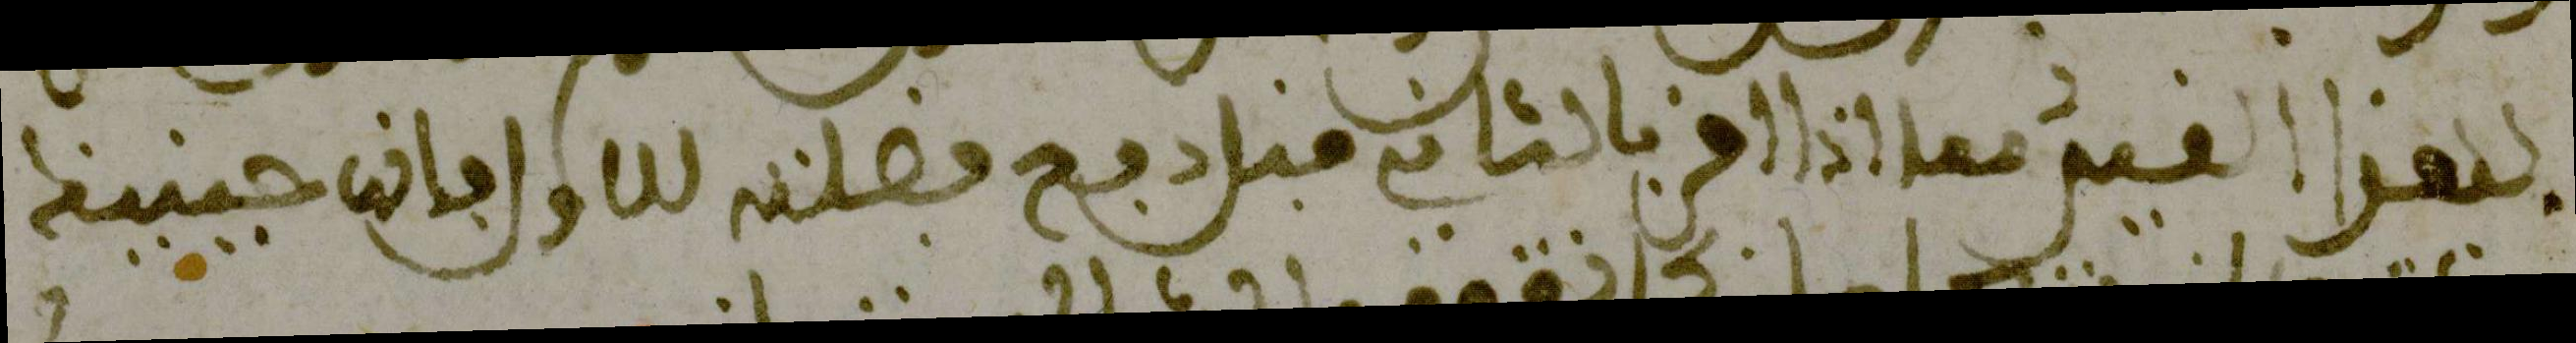بهذا القيد مما اذا اقر بالثاني قبل دفع فضلته للاول فانها حينيذ
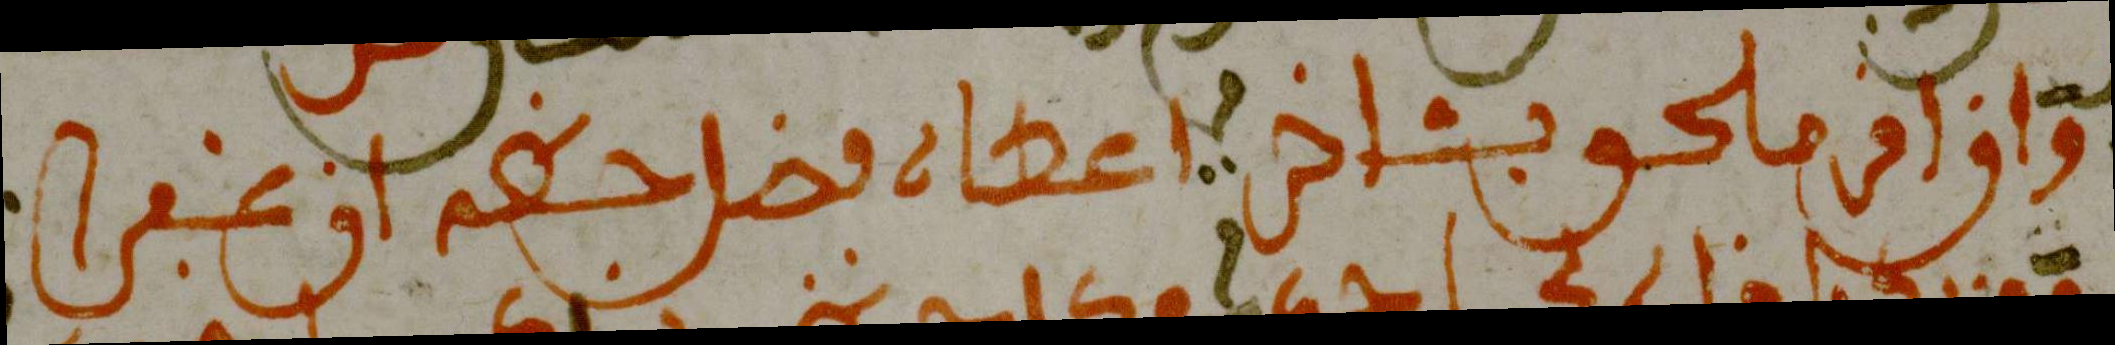وان اقر ملحق بئاخر اعطاه فضل حظه ان عبرا
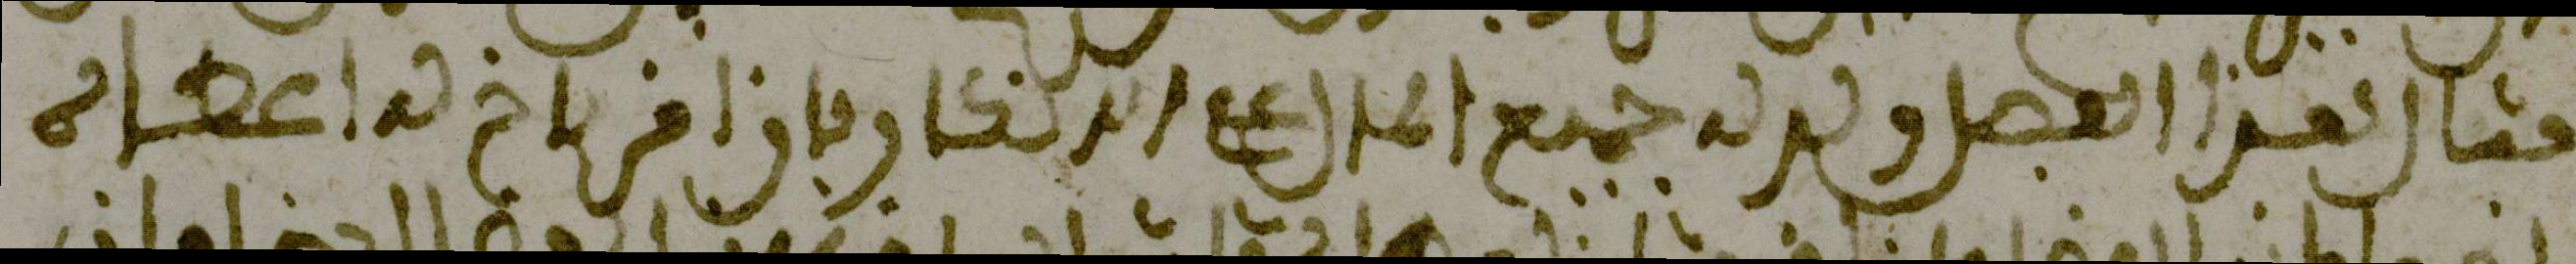مثال هذا الفصل ولد له جميع المال على الانكار فان اقر باخ له اعطاه
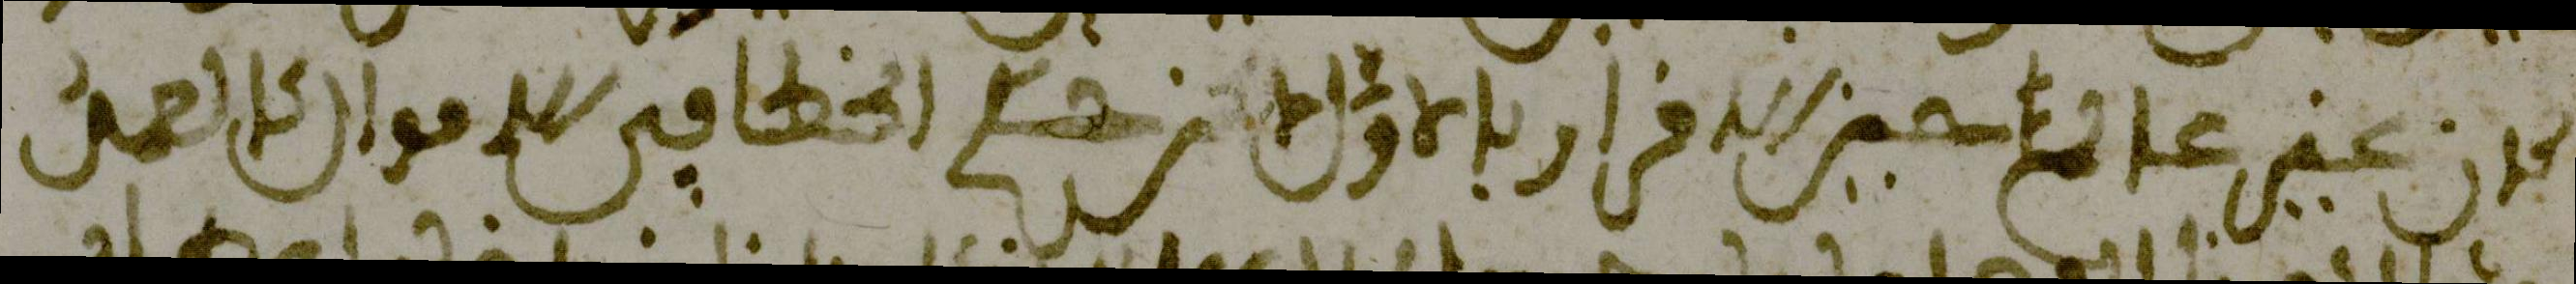كان غير عالم ا خين الاقرار بالاوَّل لان حكم الخطا في الاموال كاعمد
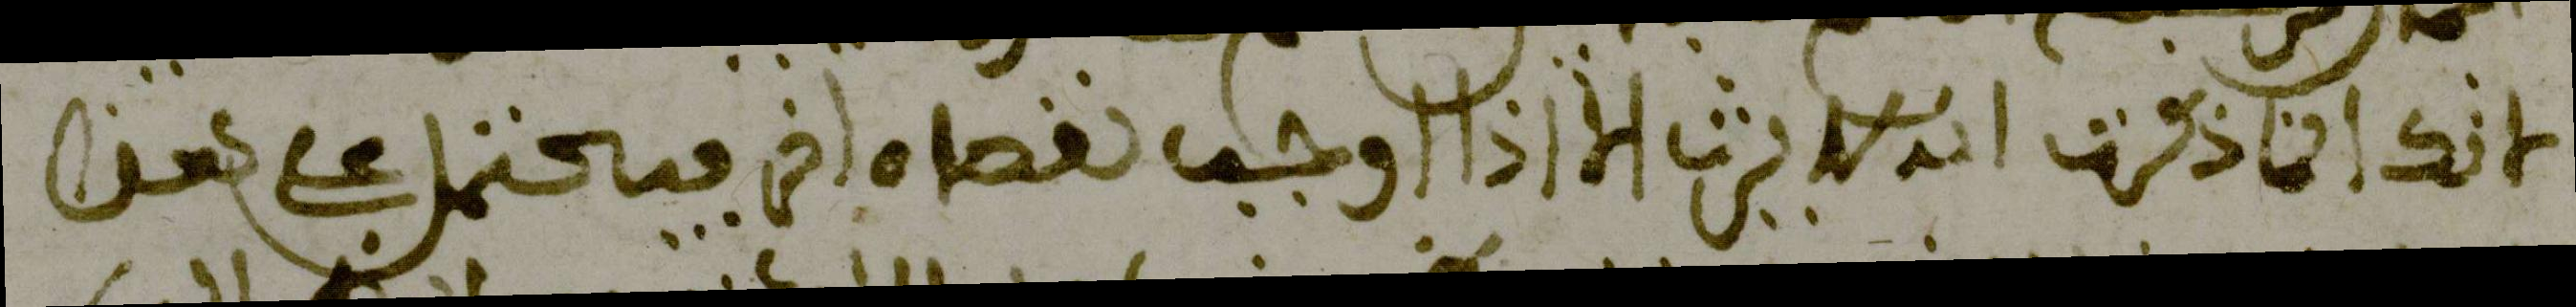لانك انما ذكرت انه لا يرث الا اذا اوجب تقصا ءاخر فيحتمل على هذا
